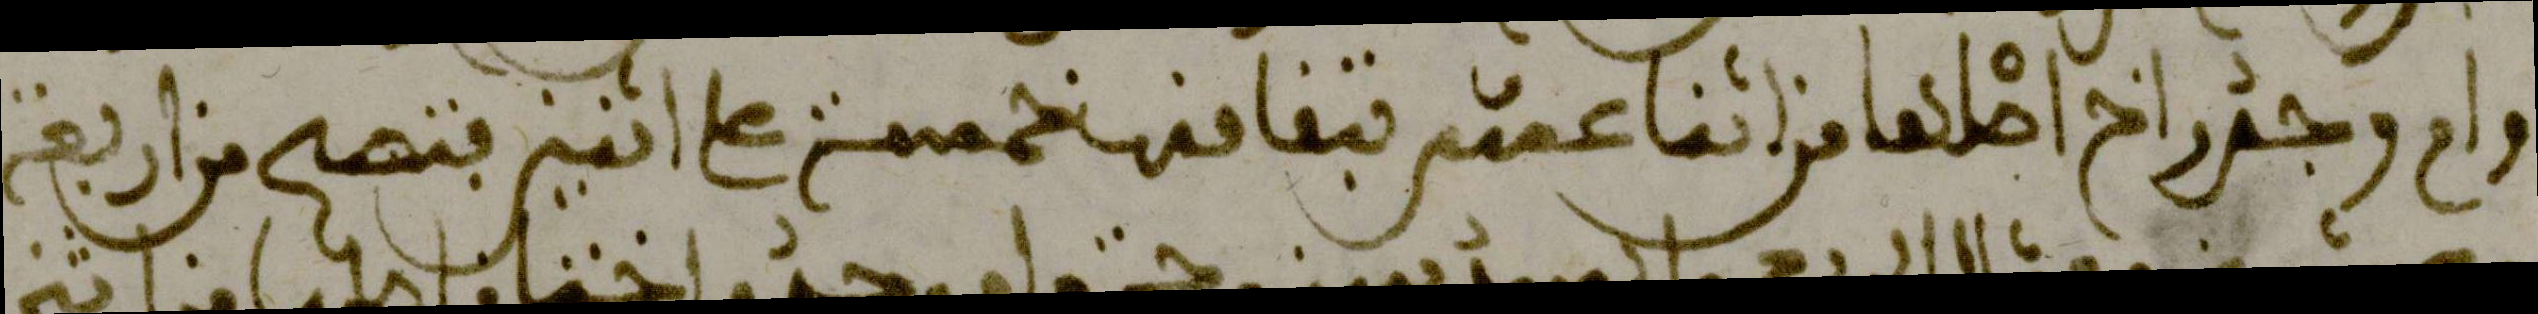وام وجد واخ اصْلها من اثنا عشر تبقا منها خمسة على اثنين فتصح من اربعة
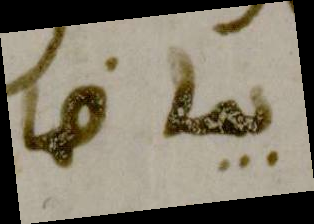بياضا
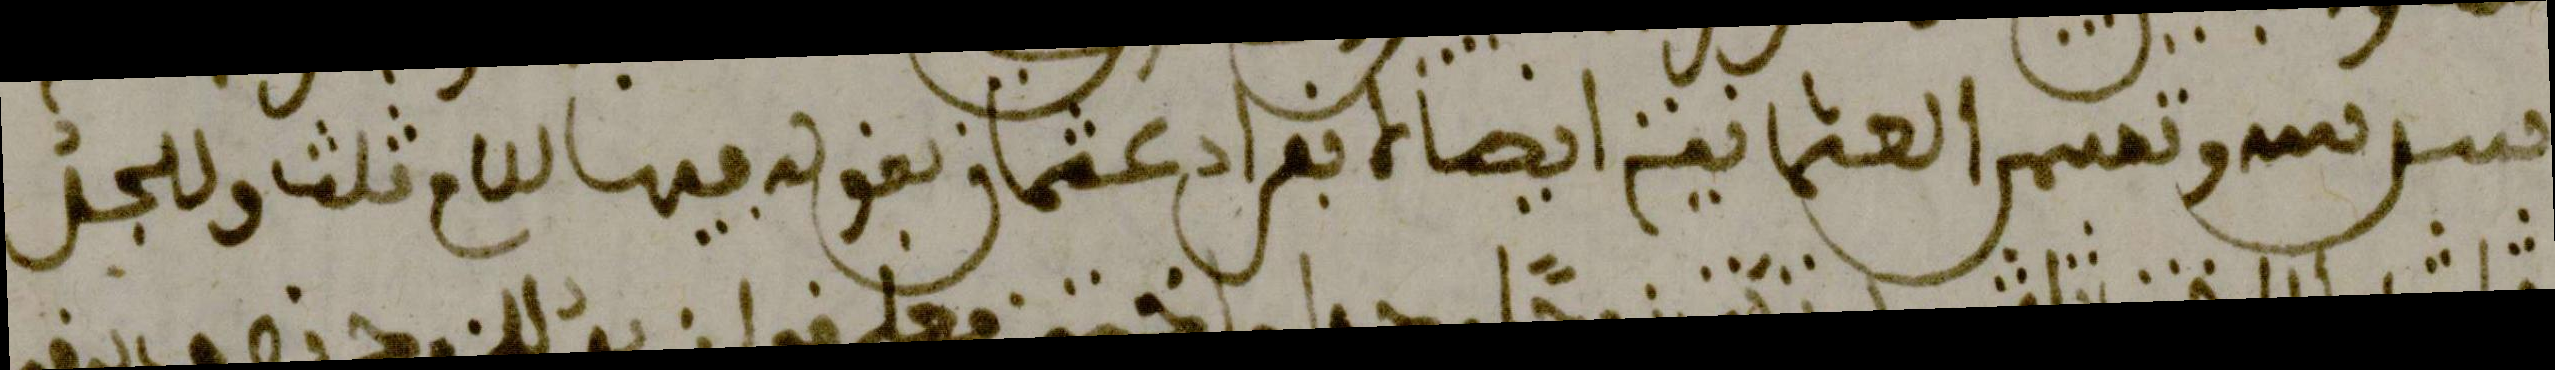سدسه وتسمى العثمانية ايضا لانفراد عثمان بقوله فيها للام ثلث وللجد
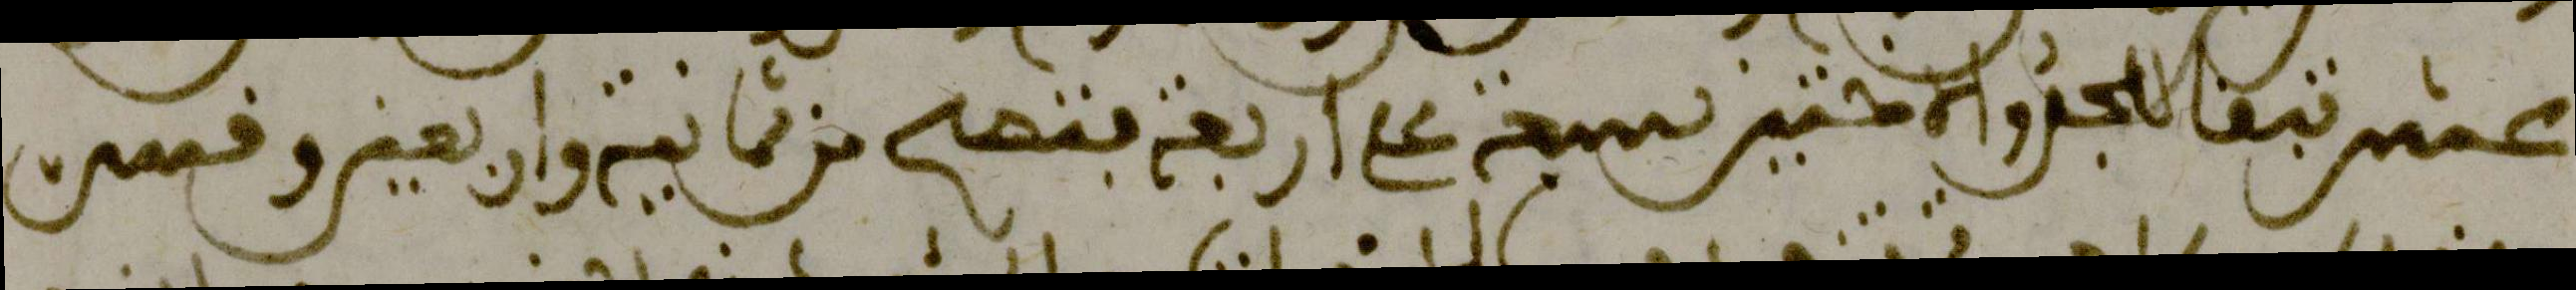عشر تبقا للجد والاختين سبعة علي اربعة فتصح من ثمانية وان بعين وقس
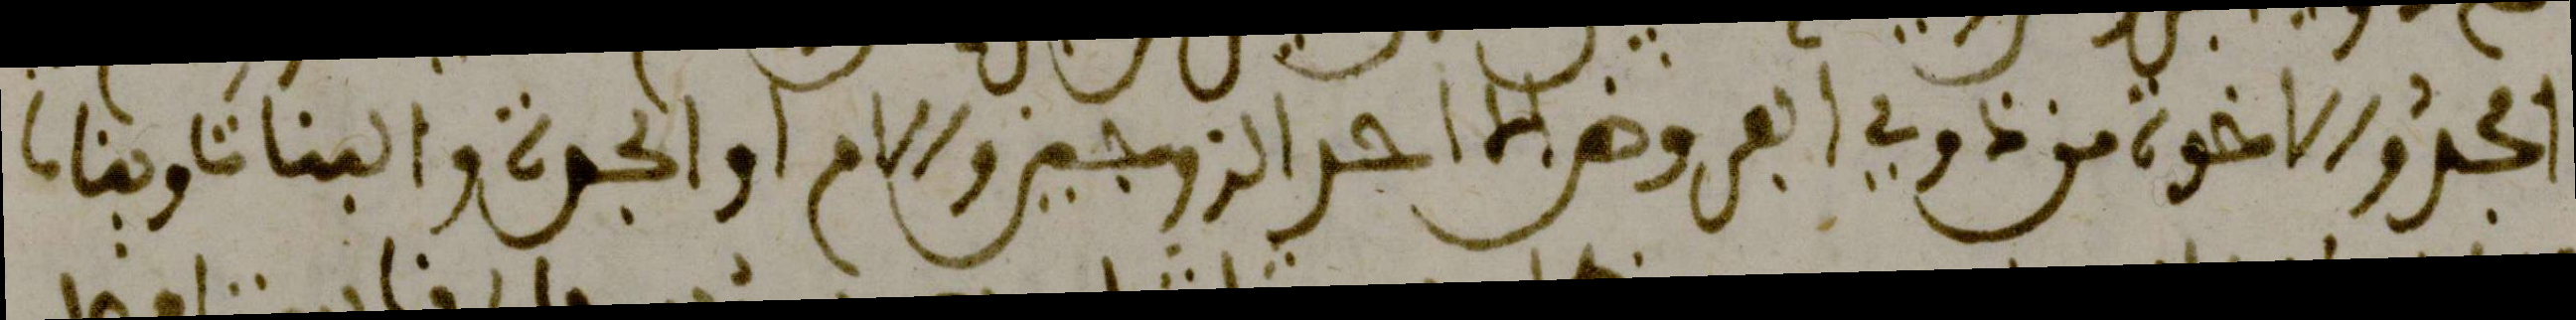الجد والاخوة من ذوي الفروض الا احد الزوجين والام او الجدة والبنات وبنات
